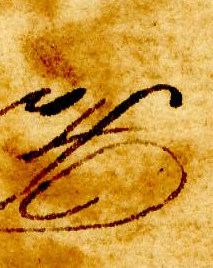For
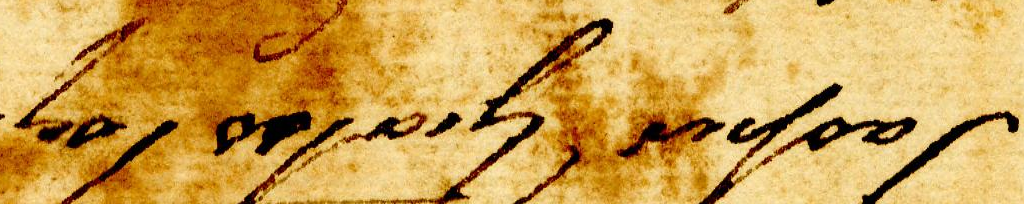Jasper Yeates Esq^r
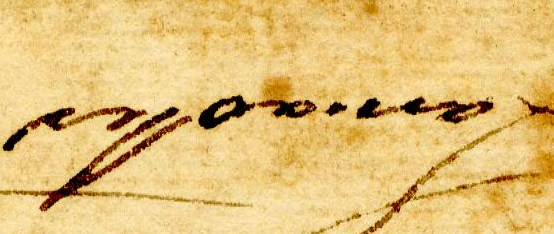Lancaster
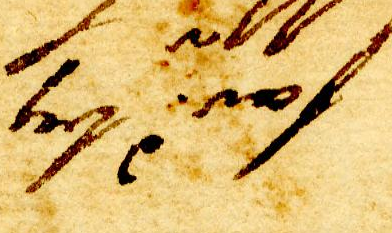fav^d by
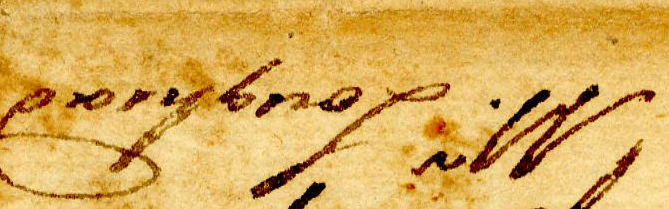M^r. Loughead
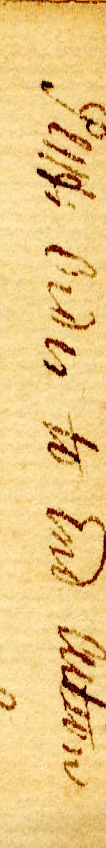Pell's Order to end Action
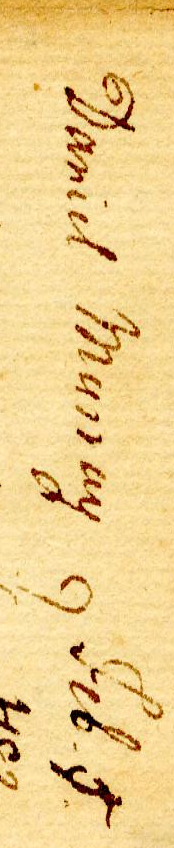Daniel Murray Feb. 5
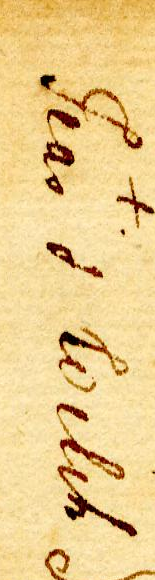Teas & Welch
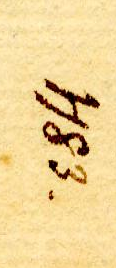1783.
